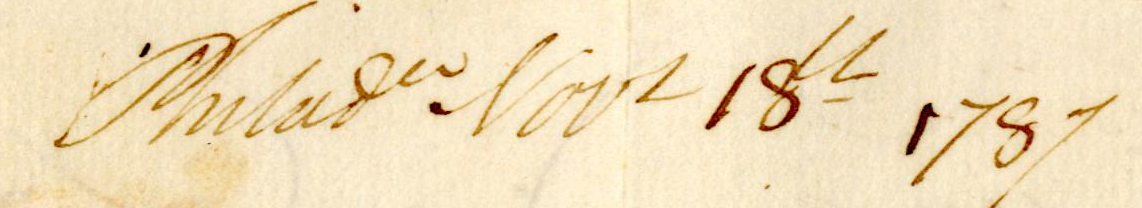Philad^a. Nov^r 18^th 1787
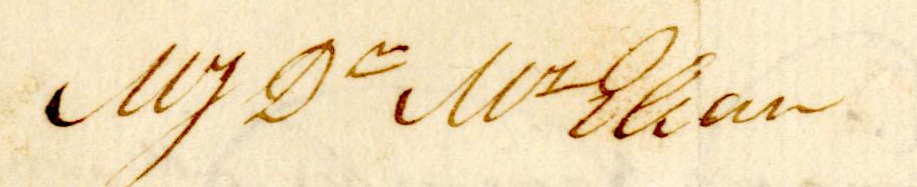My D^r M^r Elcan
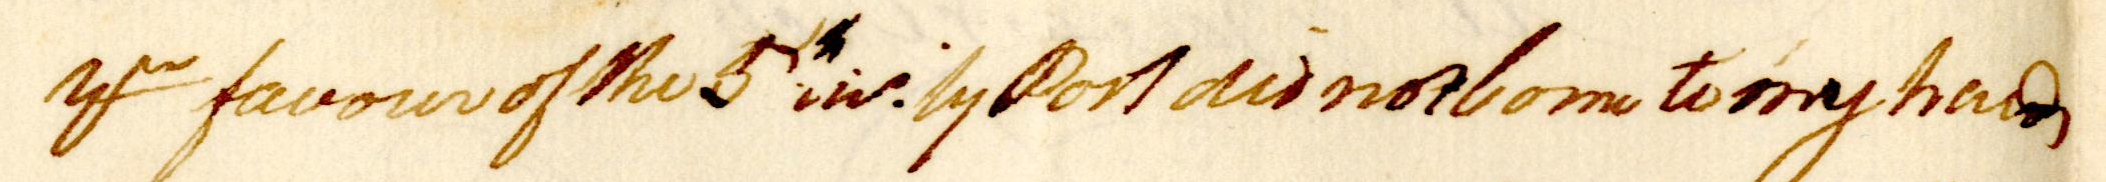y^r favour of the 5^th aug by Post did not come to my hand
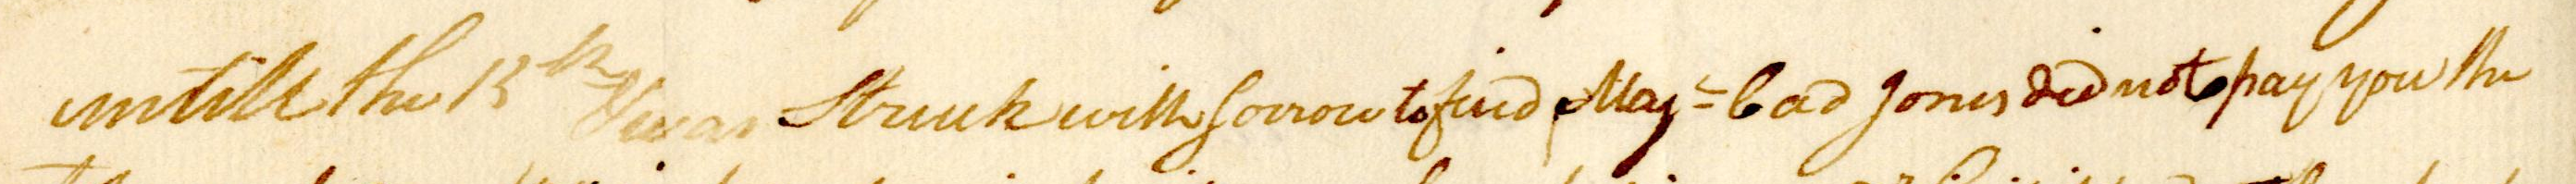untill the 13^th I was Struck with sorrow to find Maj^r. Cad Jones did not pay you the
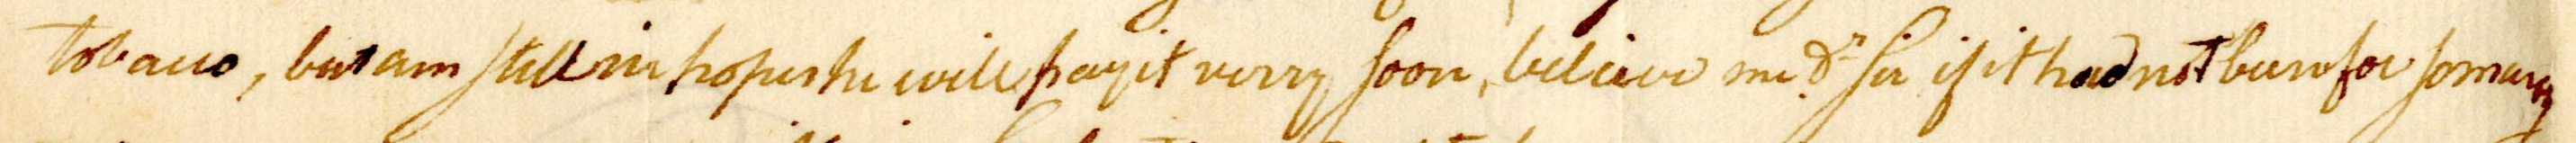tobacco, but am still in hopes he will pay it very soon, believe me d^r sir if it had not been for so many
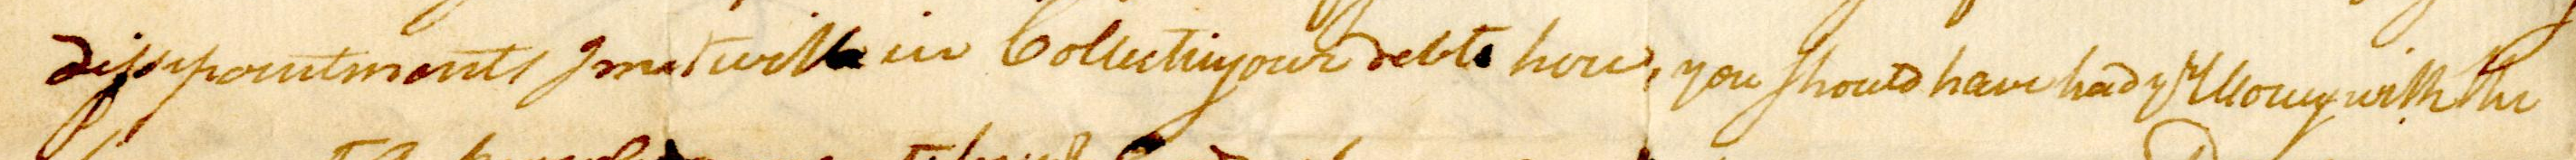dissapointments I met wile in Collecting our debts here, you should have had y^e Money with the
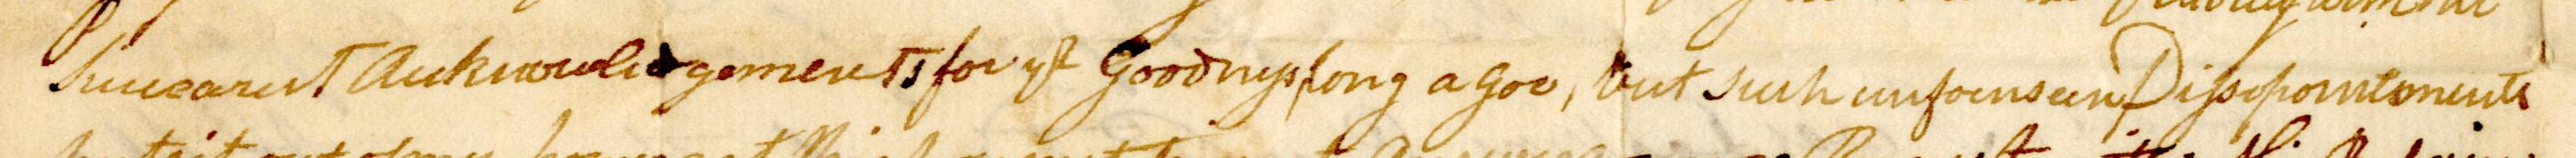sincearest Acknowledgements for y^e Goodness long agoe, but such unforeseen Disappointments
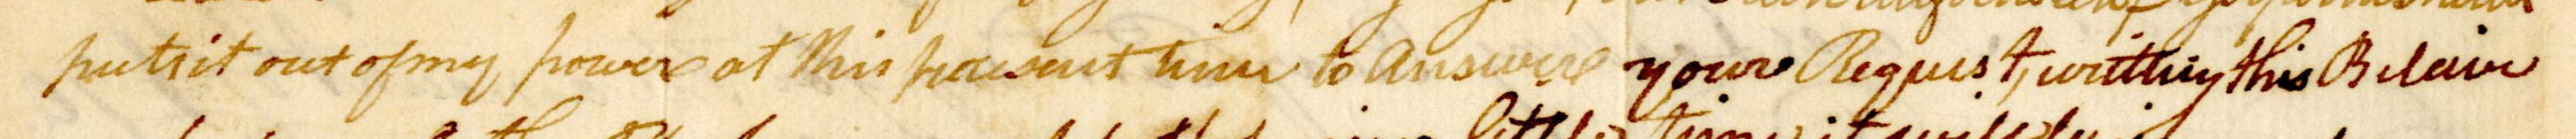puts it out of my power at this present time to Answer your Request &, writting this Beleive
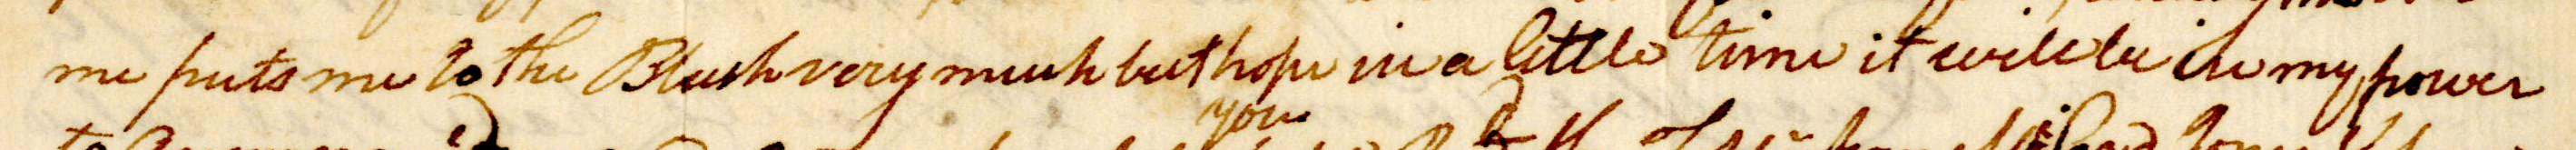me puts me to the Blush very much but hope in a little time it will be in my power
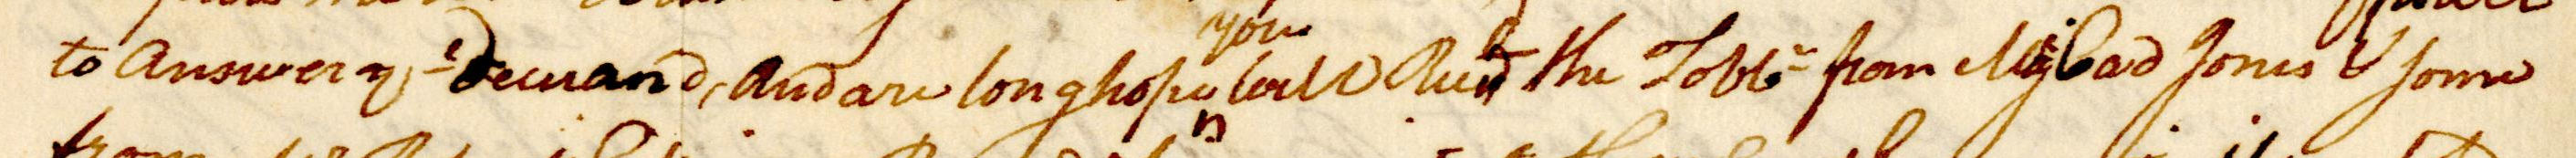to Answer y^e demand, and are long hope ^ could Rece^d the Tobb^o from Ms Cad Jones & some
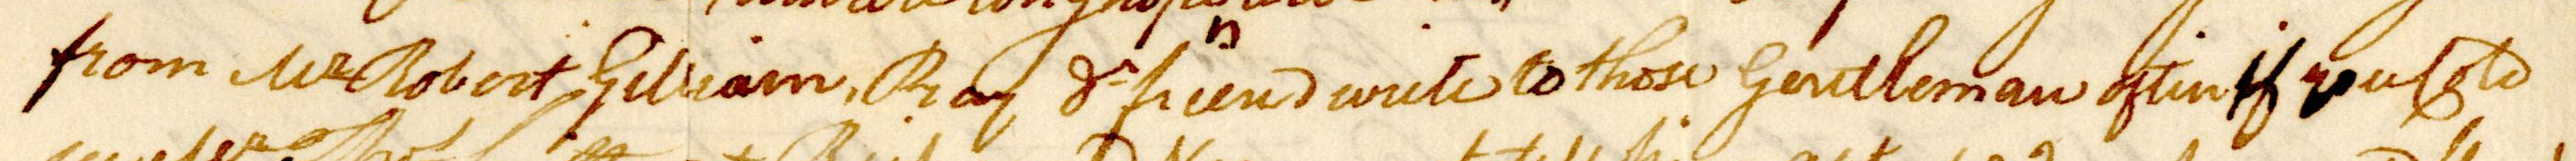from M^r Robert Gilliam, Pray d^r friend write to those Gentleman oftin lf you cold
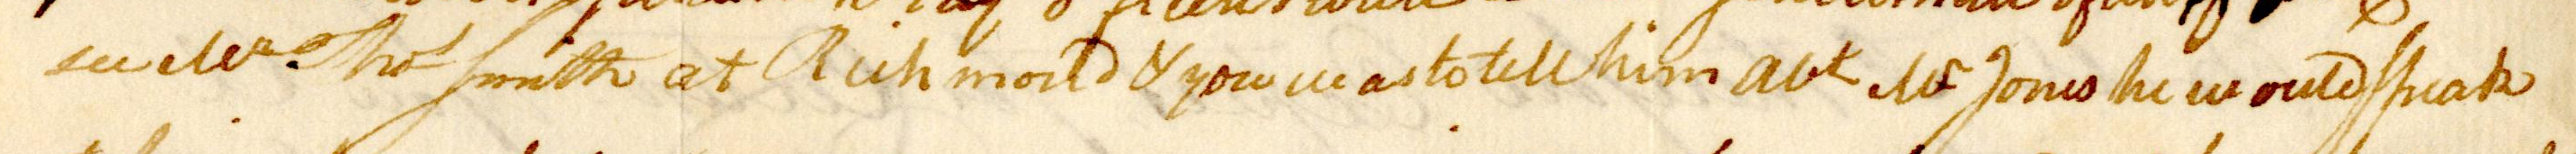see M^r Tho^s smith at Richmond & you was to tell him ab^t M^r Jones he would speak
